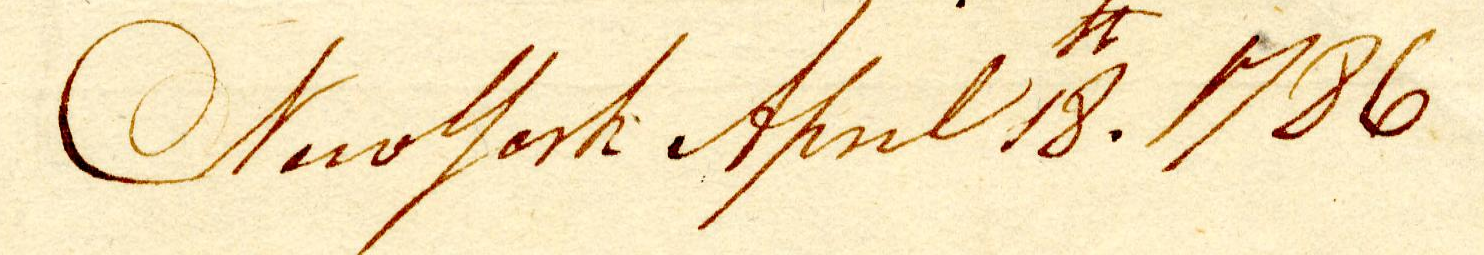New York April 18^th. 1786
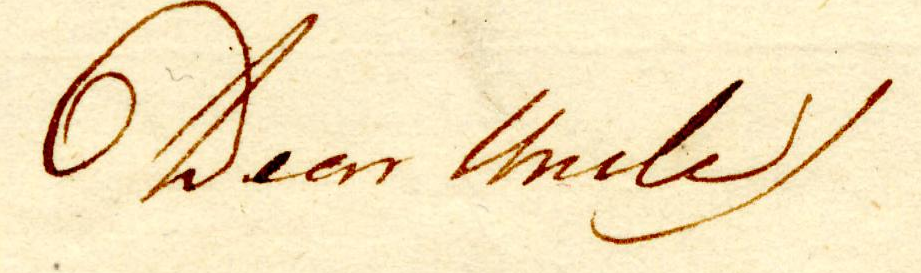Dear Uncle)
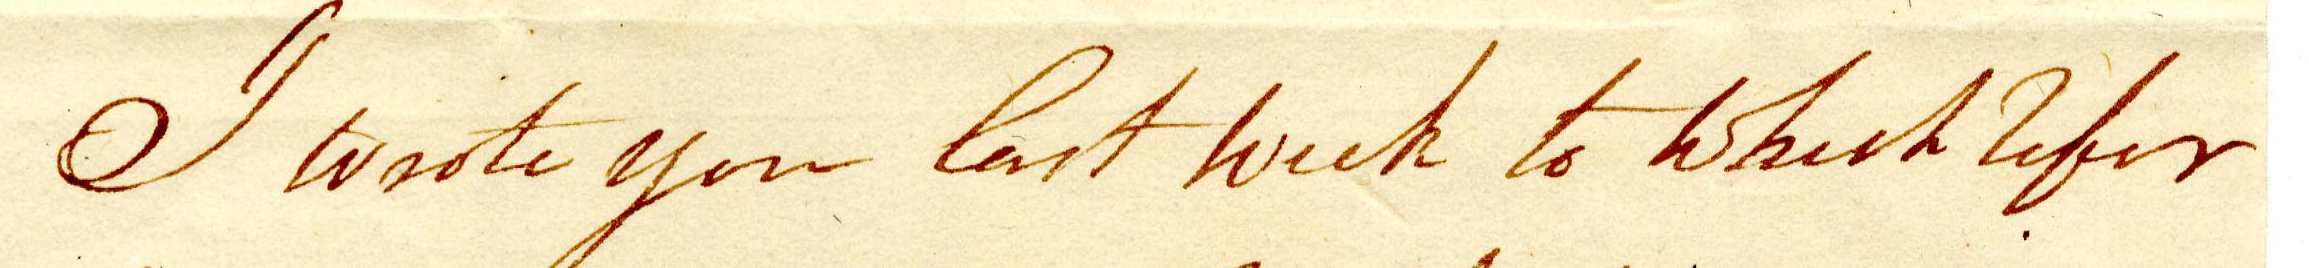I wrote you last week to which after
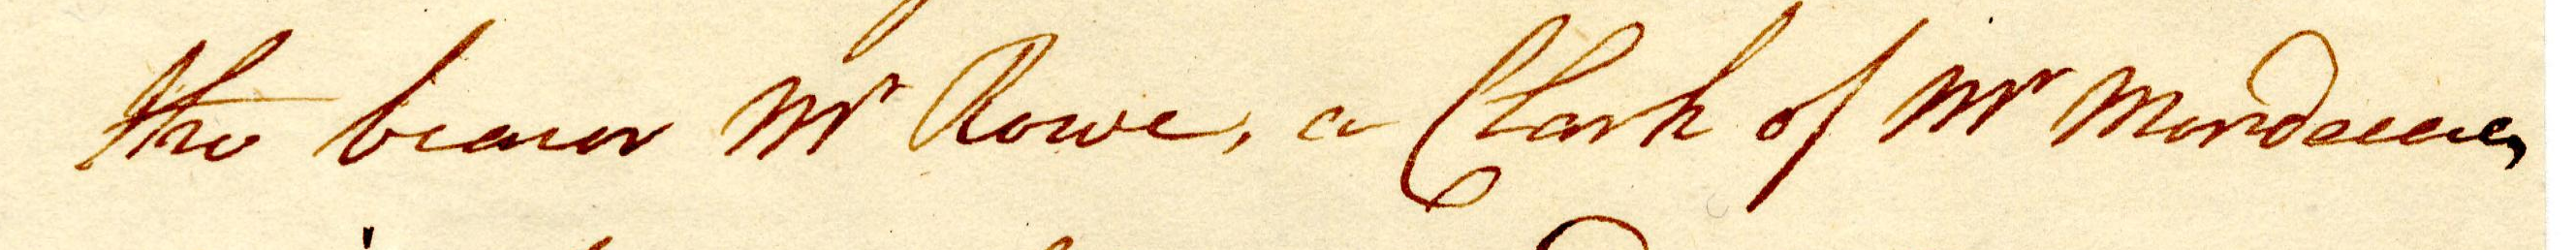the bearer M^r. Rowe, a Clerk of M^r Mordecae
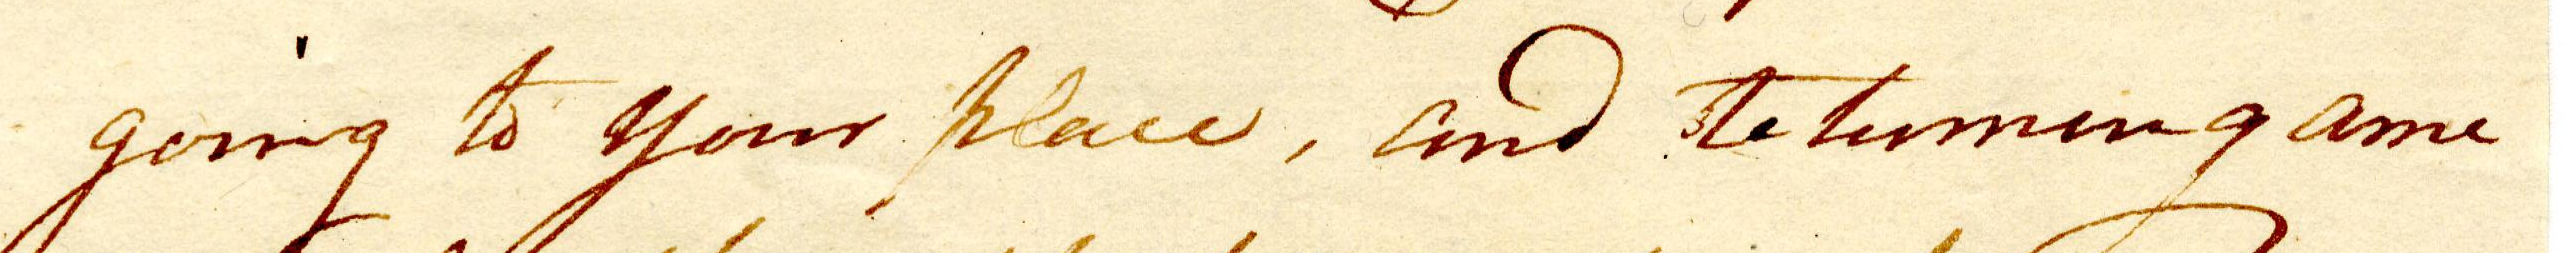going to Your place, and returning ame
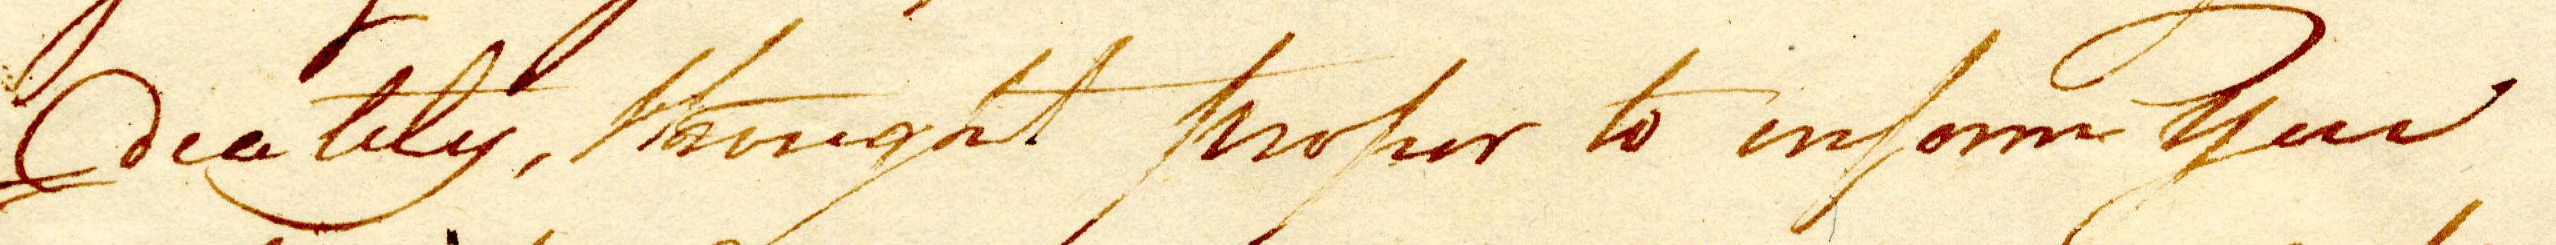-deately, thought proper to inform you
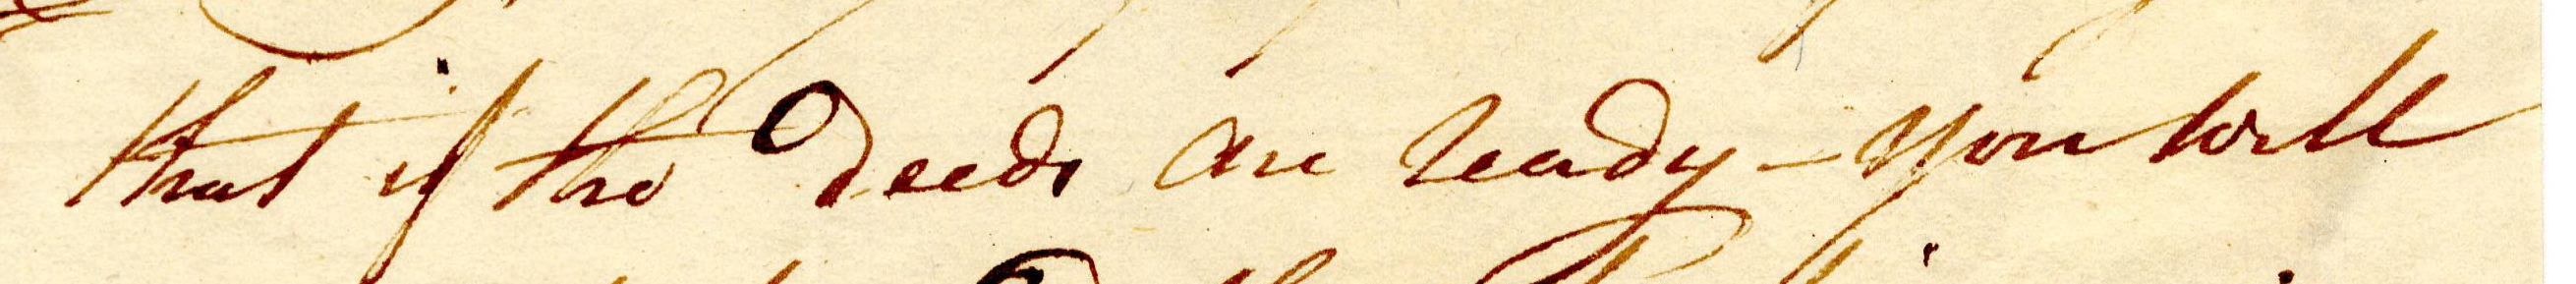that if the deeds are ready- you Will
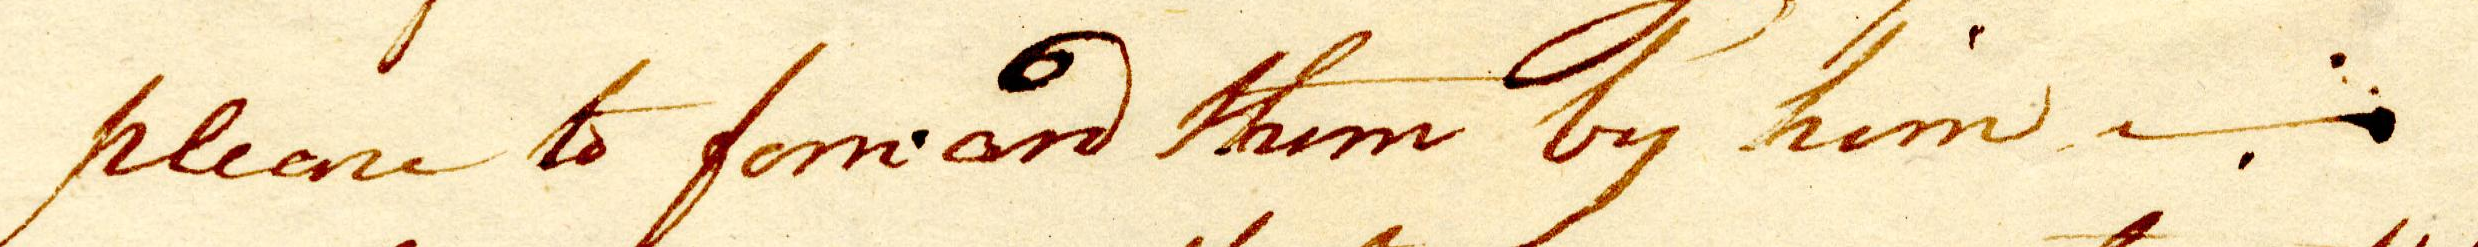please to forward them by him-
